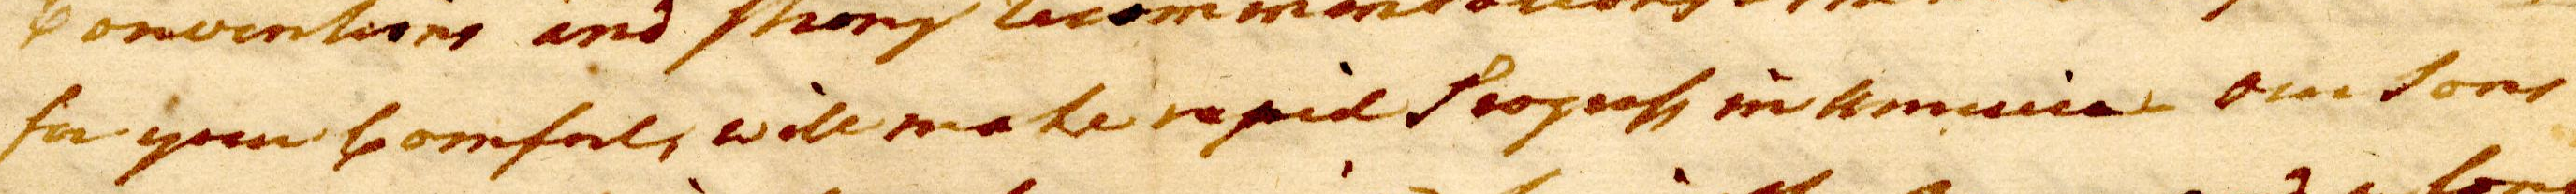for your Comforts will make rapid progress in America our sons
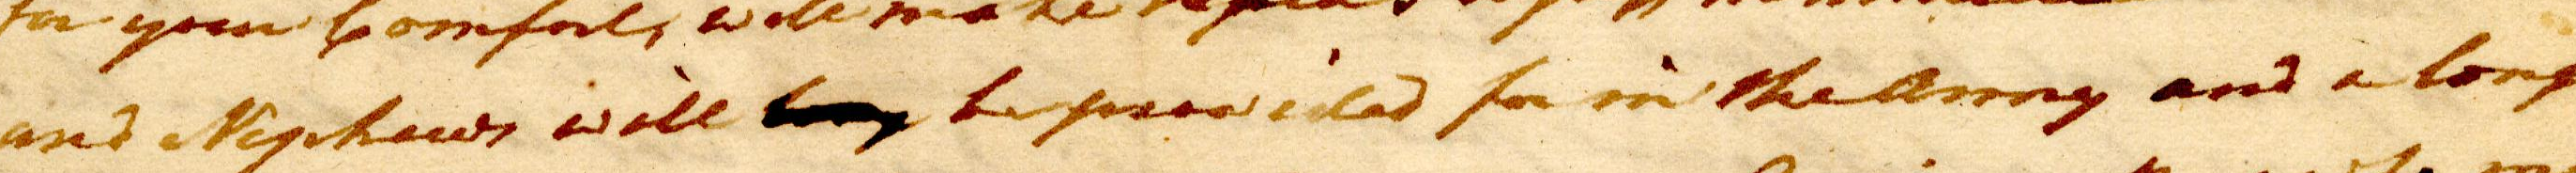and Nephews will [__] be provided for in the Army and a long
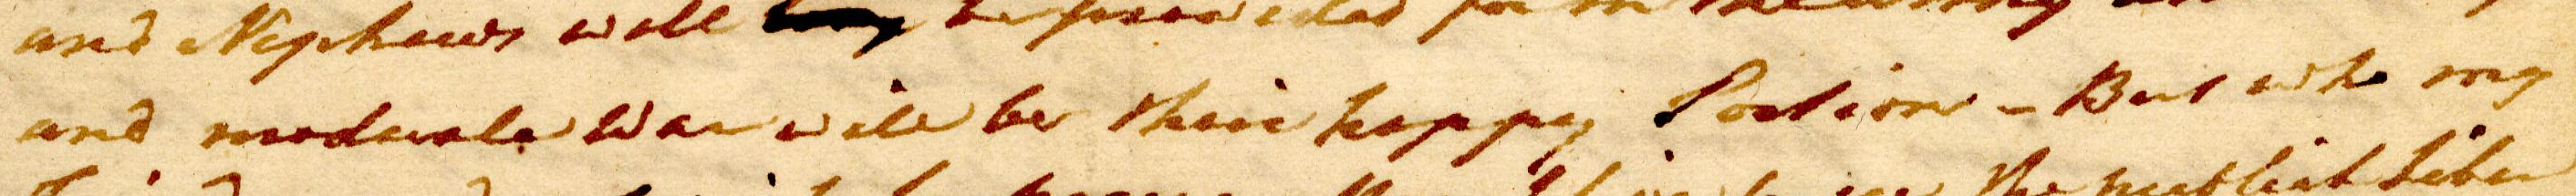and arduous war will be their happy Portion- But who my
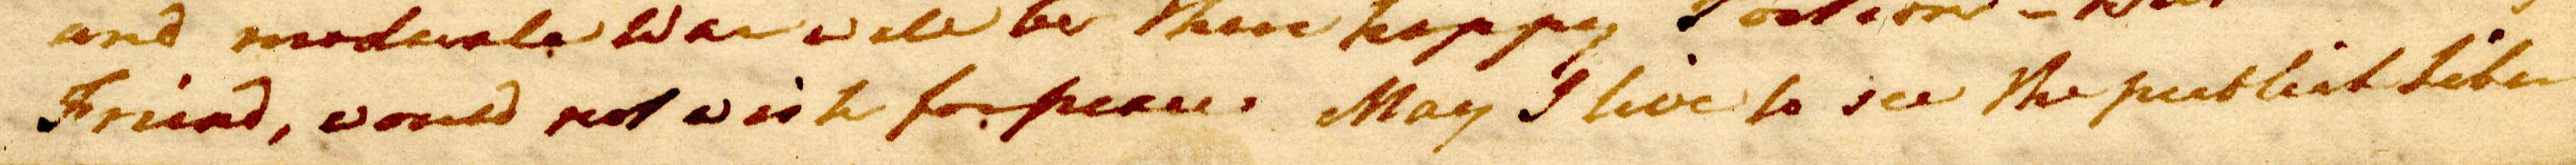Friend, would not wish for peace. May I live to see the perfect Liber-
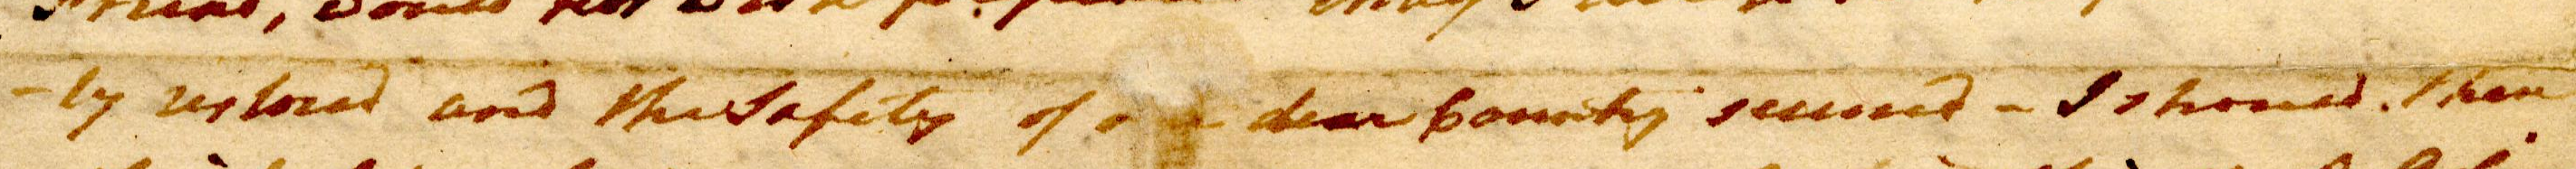-ty restored and the safety of a dear country succeed- I should, then
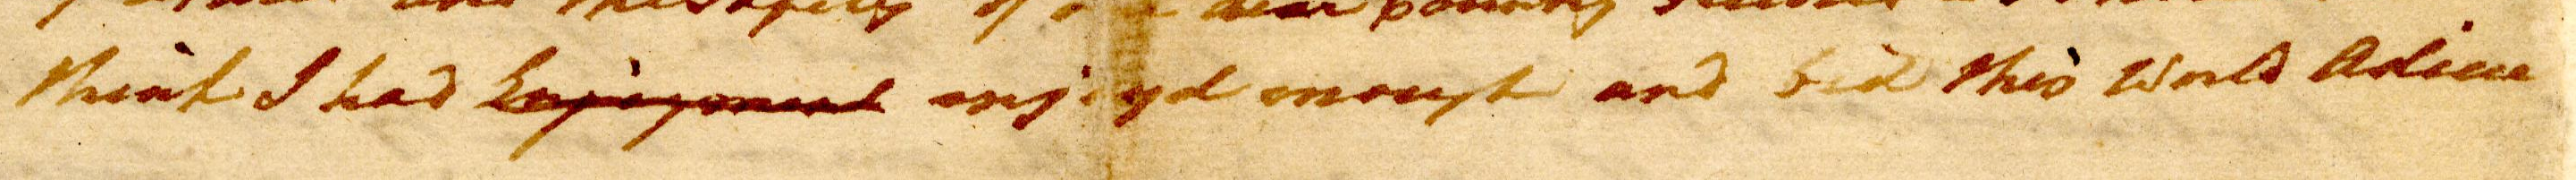think I had [_______] ensigned enough and bid this world Adieu
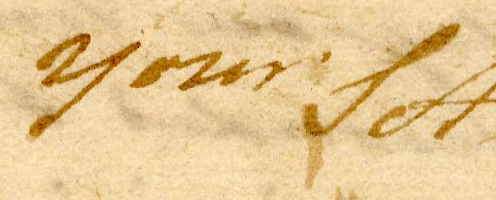your SA
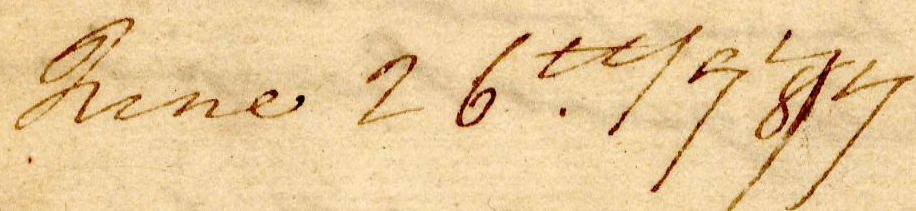June 26^th. 1777
